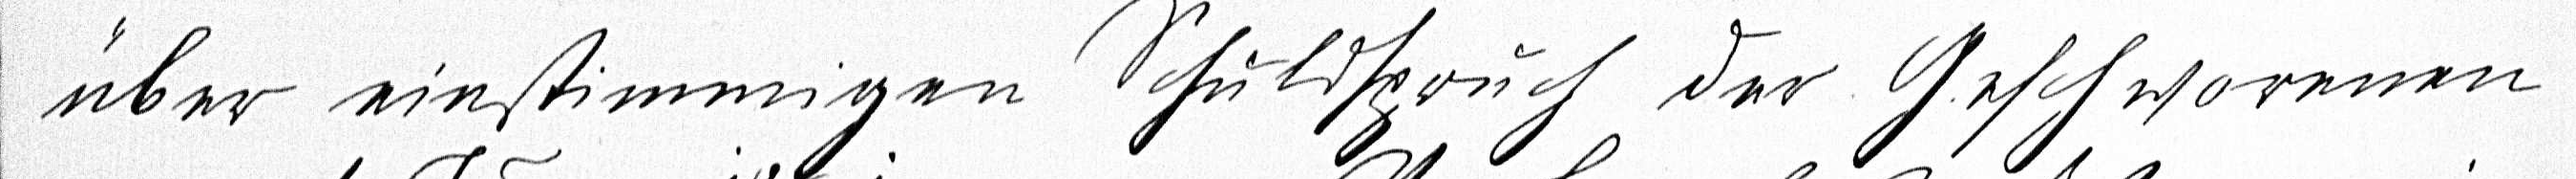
(Nowy Sącz) über eintstimmigen Schuldspruch der Geschworenen
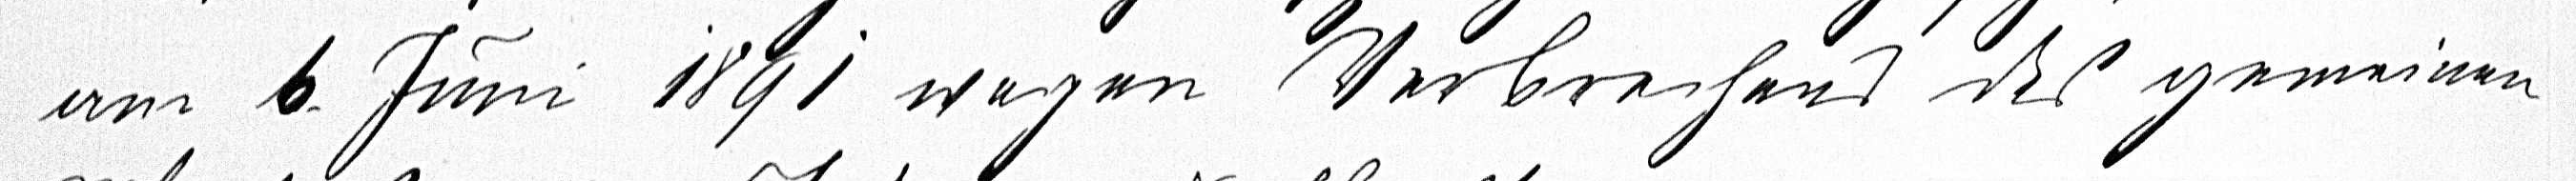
am 6. Juni 1891 wegen Verbrechens des gemeinen
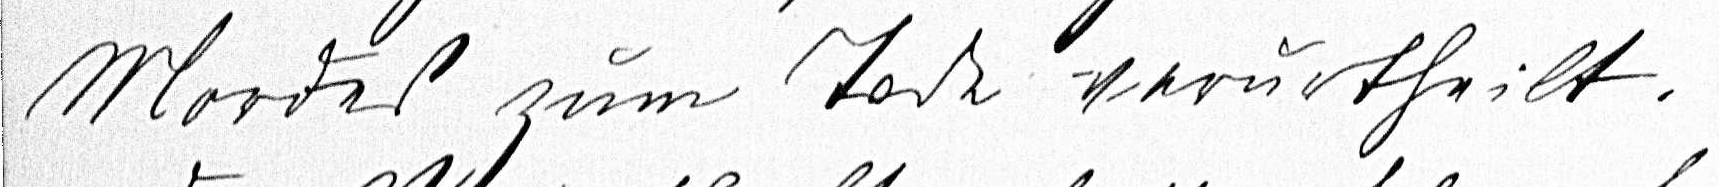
Mordes zum Tode verurtheilt.
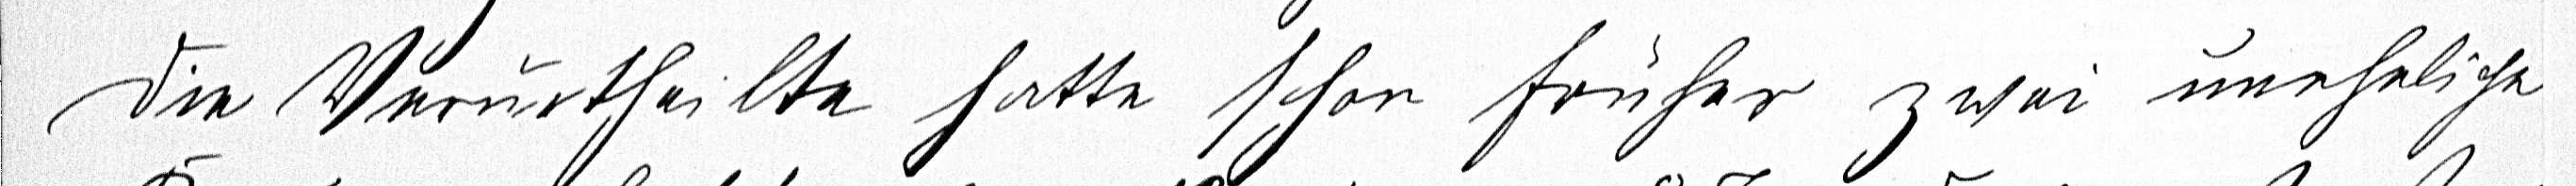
Die Verurtheilte hatte schon früher zwei uneheliche
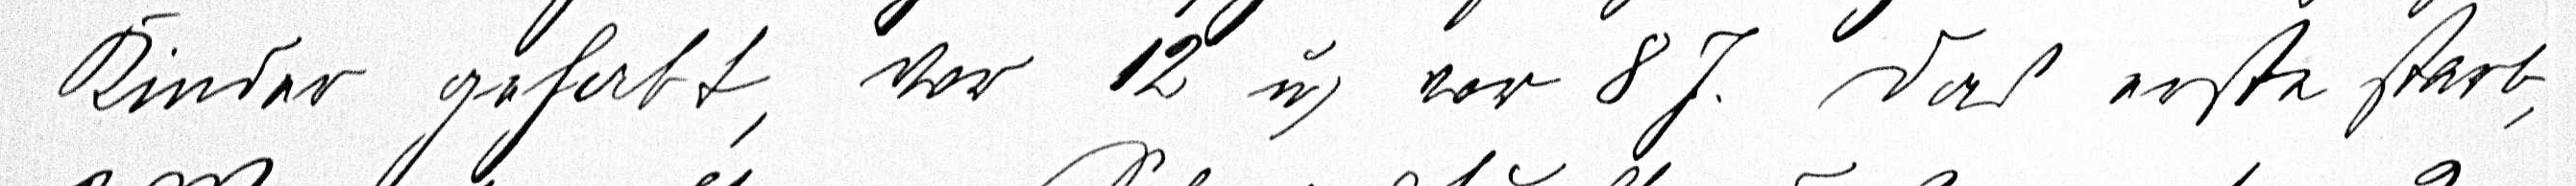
Kinder gehabt, vor 12 u) vor 8 J. Das erste starb,
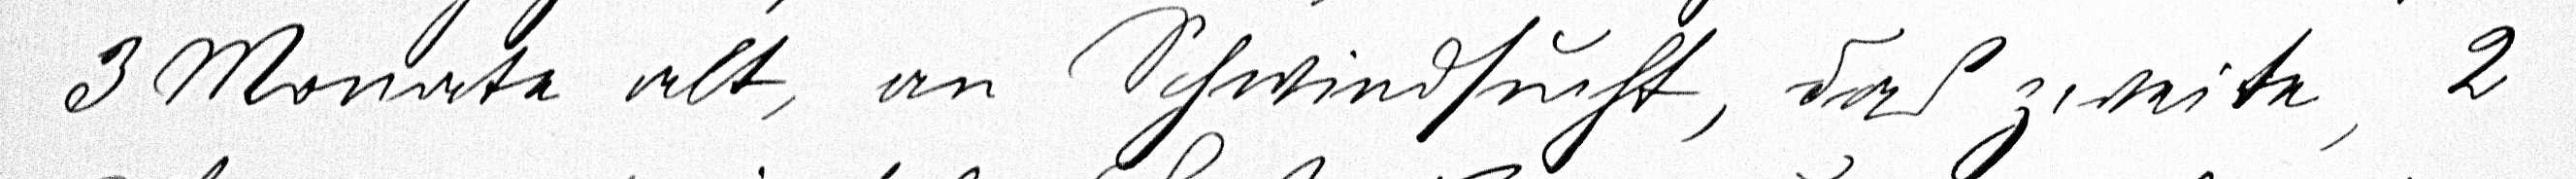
3 Monate alt, an Schwindsucht, das zweite, 2
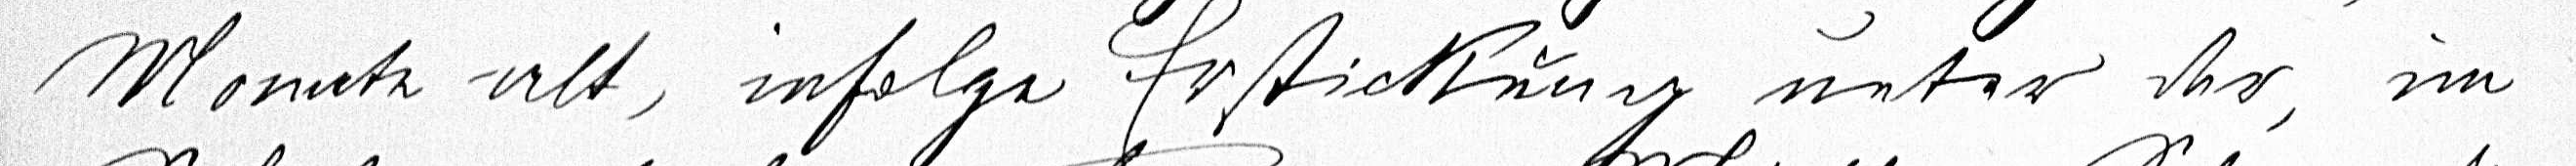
Monate alt, infolge Erstickung unter der, im
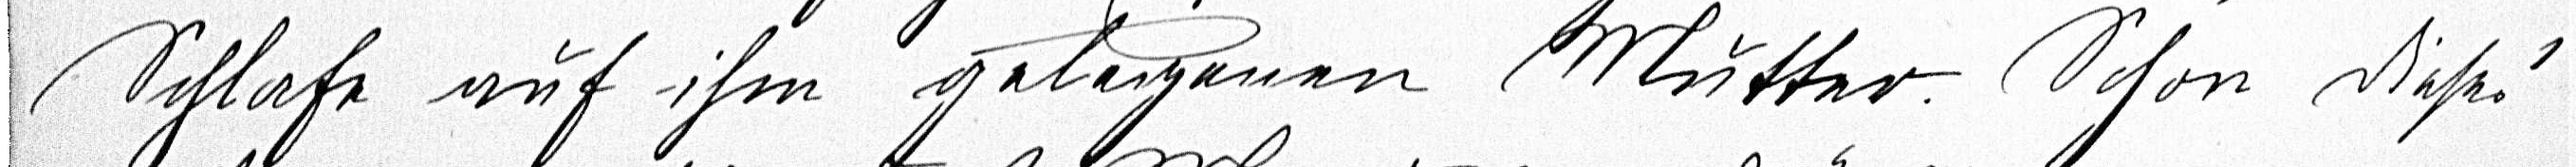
Schlafe auf ihm gelegenen Mutter. Schon diese
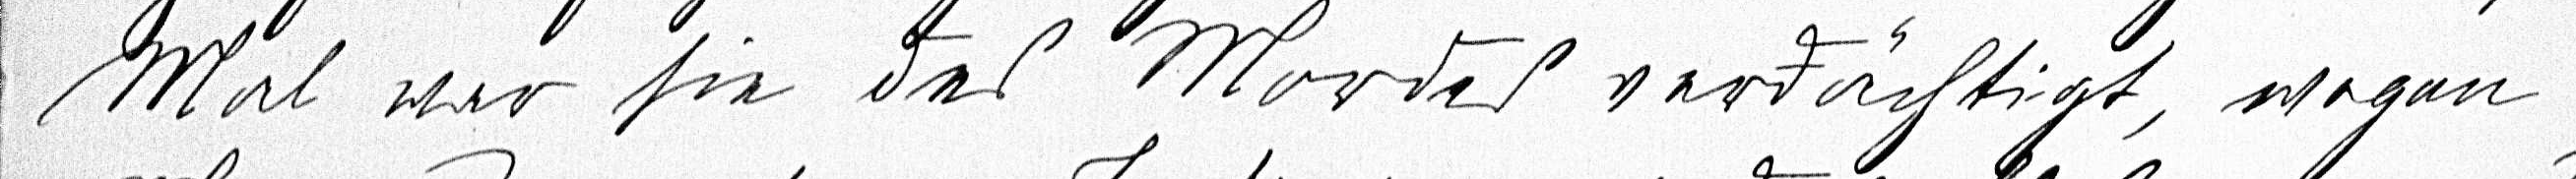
Mal war sie das Mordes verdächtigt, wegen
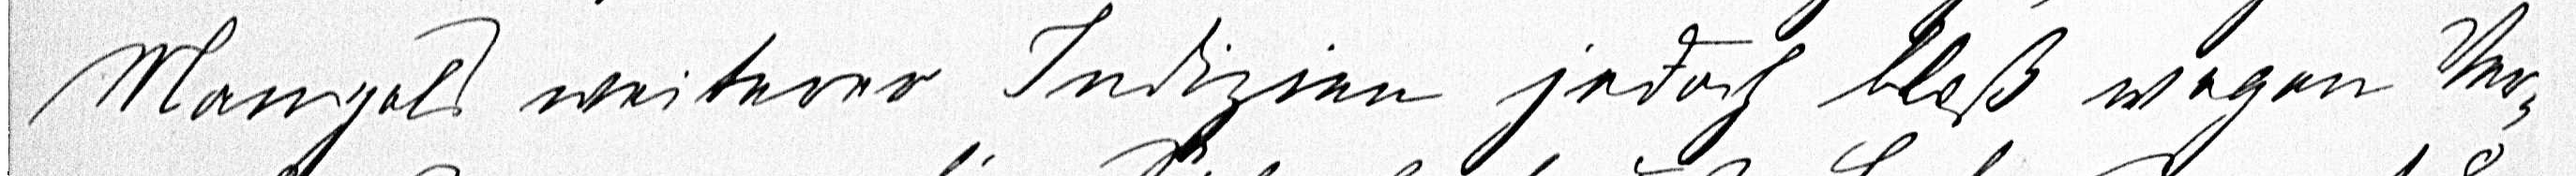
Mangels weiterer Indizien jedoch bloß wegen Ver¬
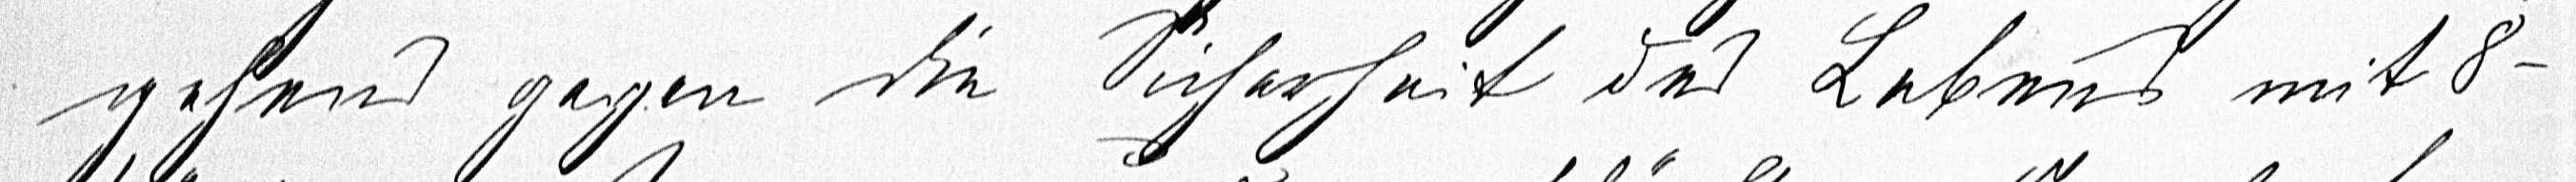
gehens gegen die Sicherheit des Lebens mit 8-
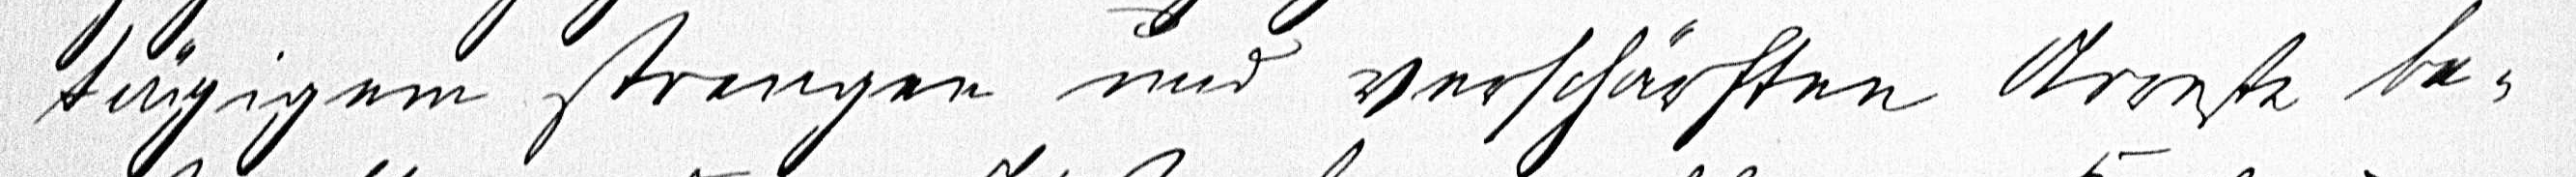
tägigem strengen und verschärften Arreste be¬
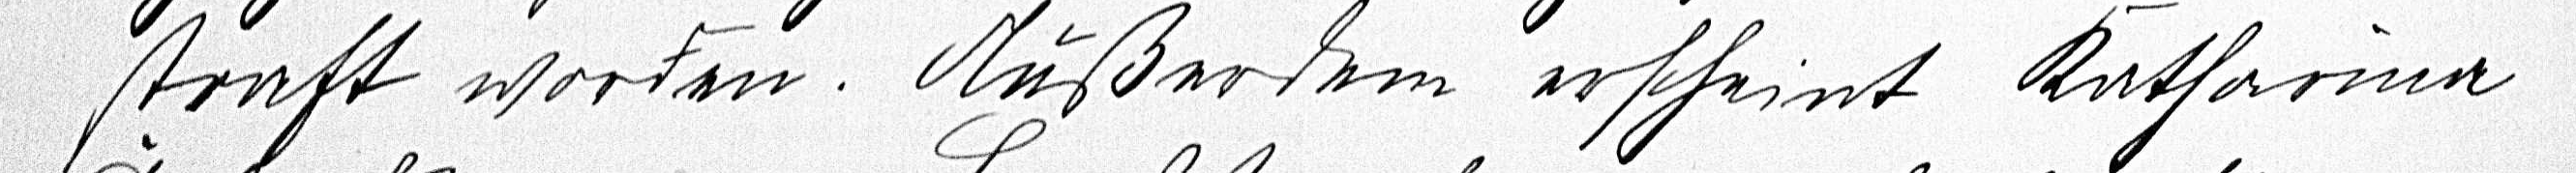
straft worden. Außerdem erscheint Katharina
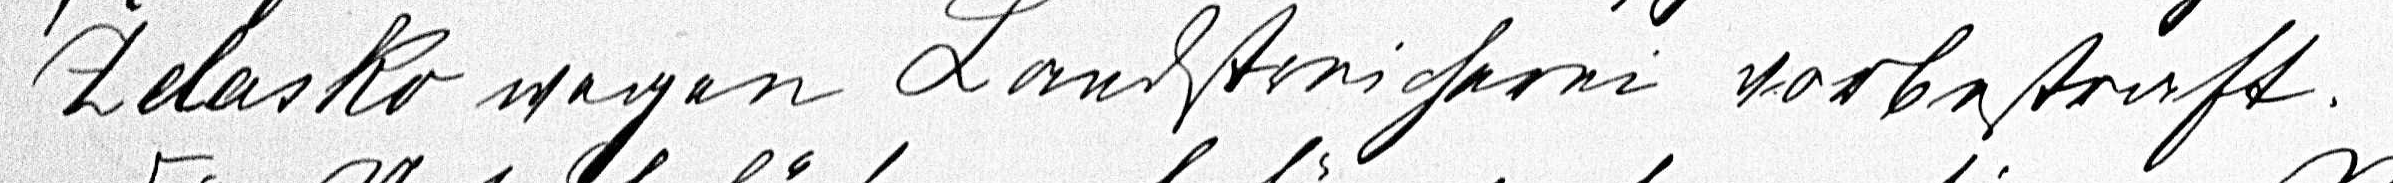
Želasko wegen Landstreicherei vorbestraft.
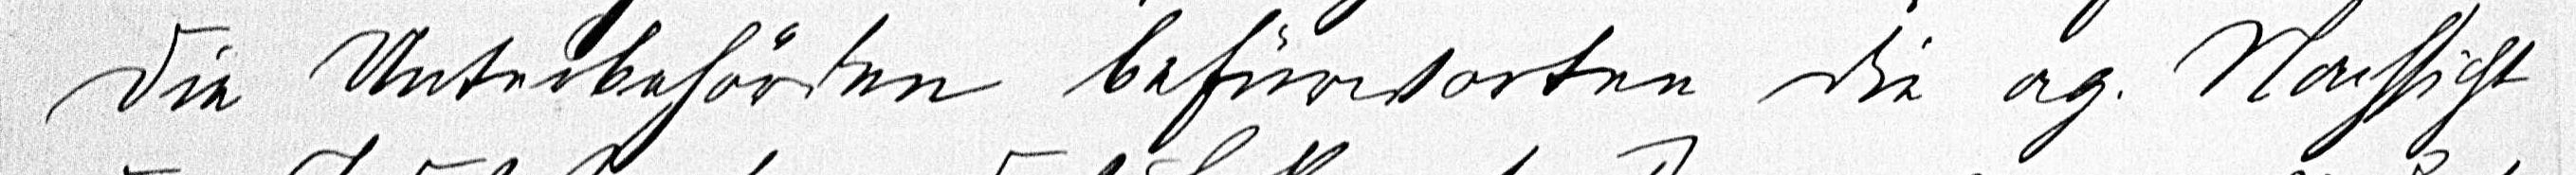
Die Unterbehörden befürworten die ag. Nachsicht
